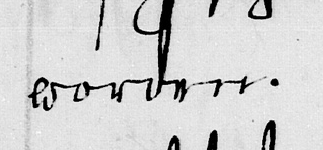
worden.
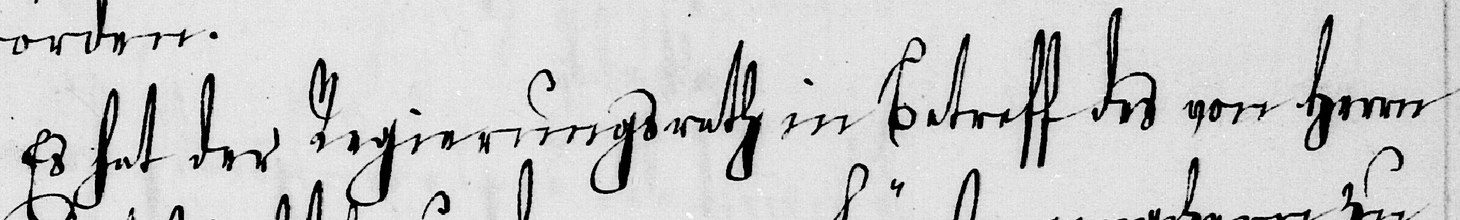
Es hat der Regierungsrath in Betreff des von Herrn
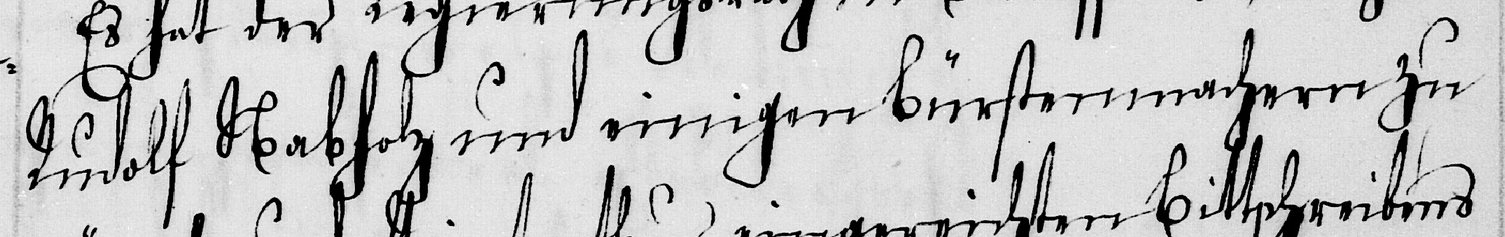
Rudolf Nabholz und einigen Bürstenmachern zu
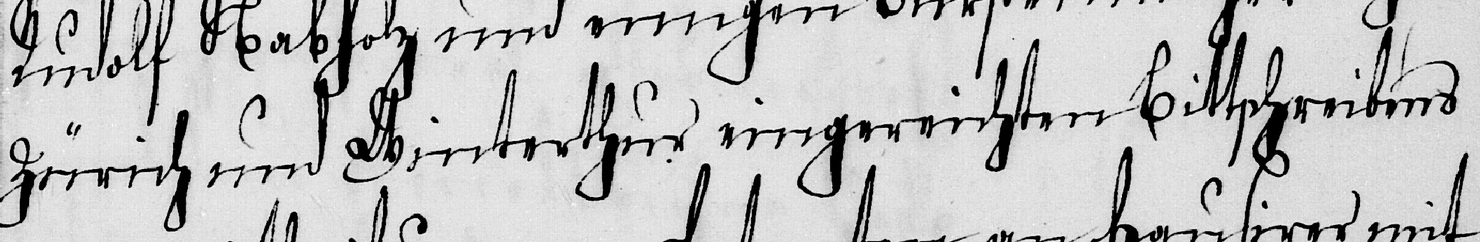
Zürich und Winterthur eingereichten Bittschreibens
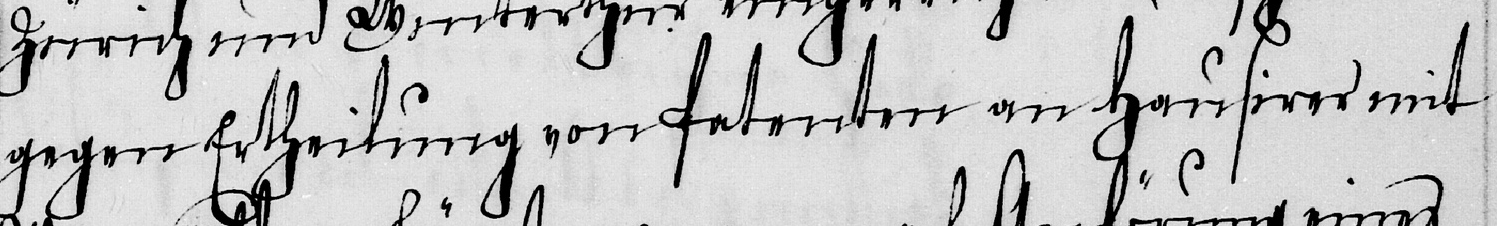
gegen Ertheilung von Patenten an Hausirer mit
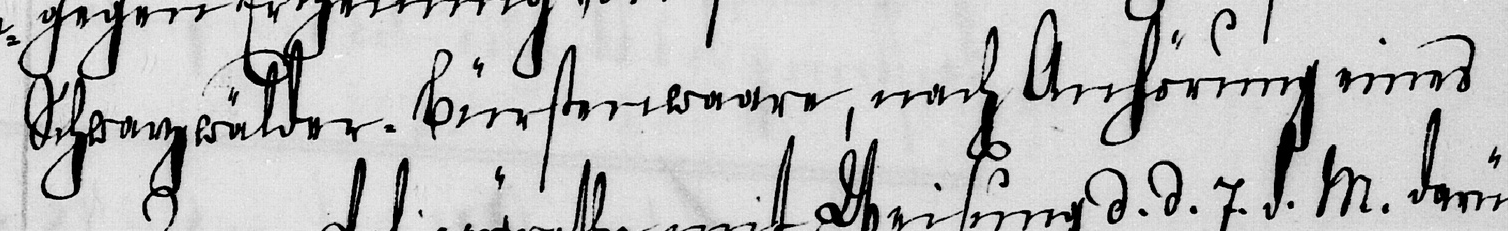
Schwarzwälder-Bürstenwaare, nach Anhörung eines
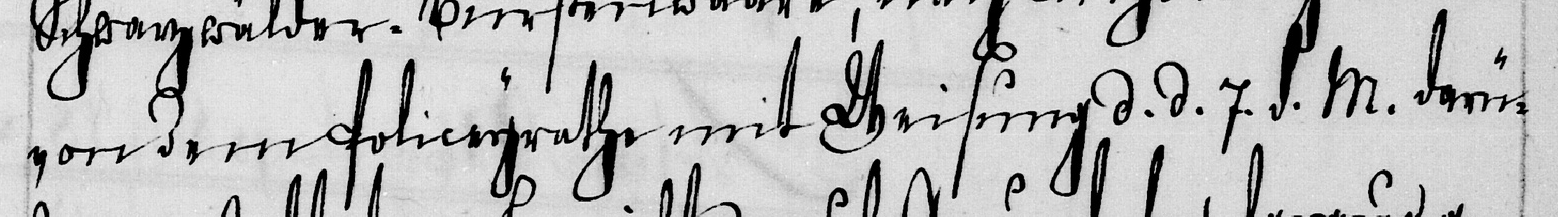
von dem Policeyrathe mit Weisung d. d. 7. d. M. darü¬
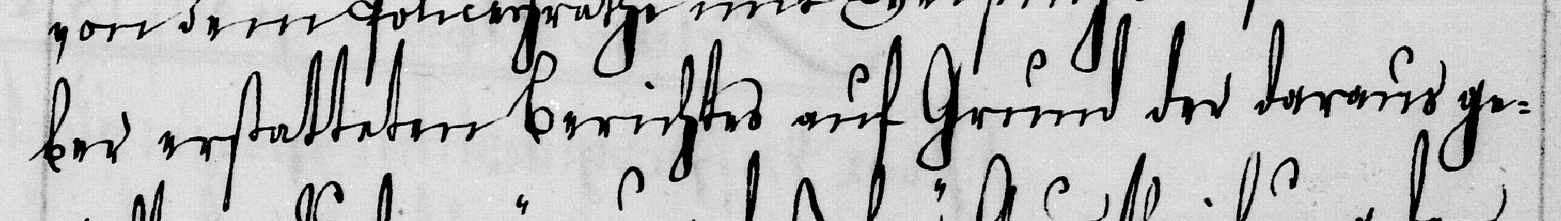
ber erstatteten Berichtes auf Grund der daraus ge¬
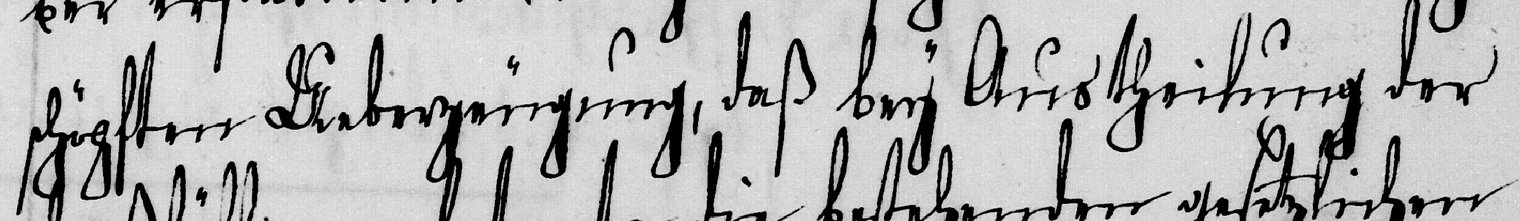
schöpften Ueberzeugung, daß bey Austheilung der
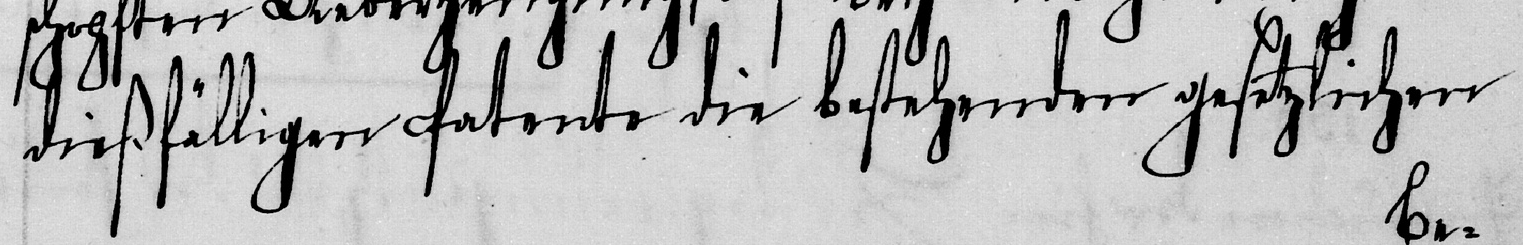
dießfälligen Patente die bestehenden gesetzlichen
